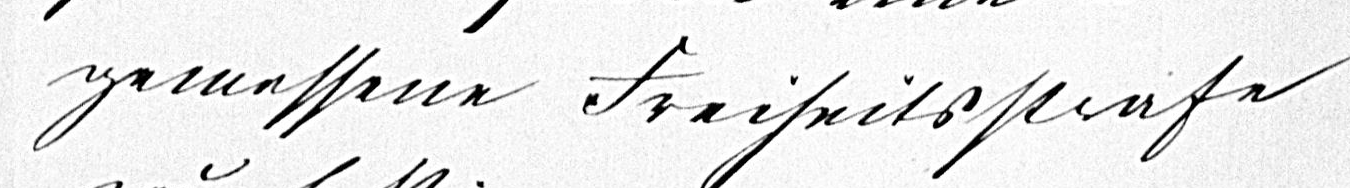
gemessene Freiheitsstrafe
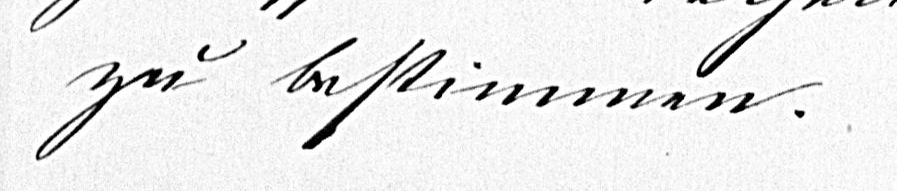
zu bestimmen.
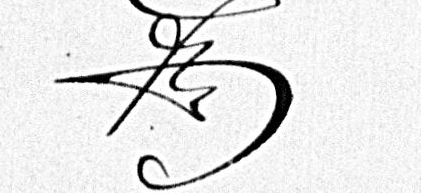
xx
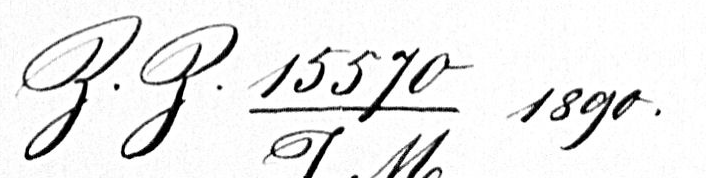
Z.Z. 15570/ 1890.
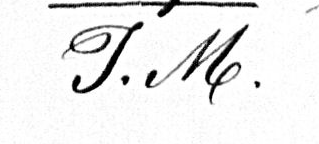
J.M.
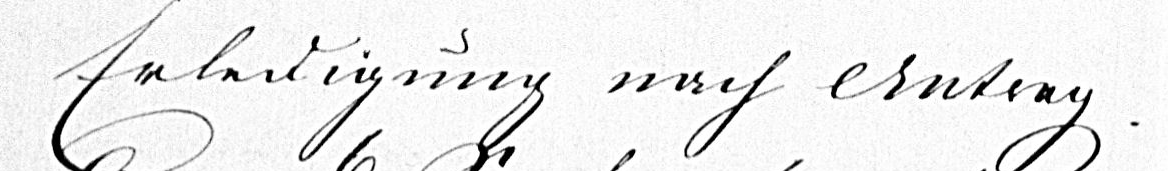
Erledigung nach Antrag.
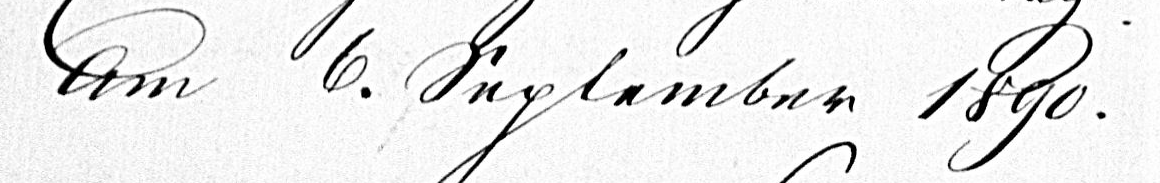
Am 6. September 1890.
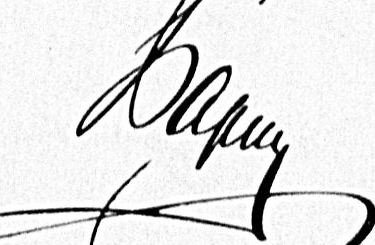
xx
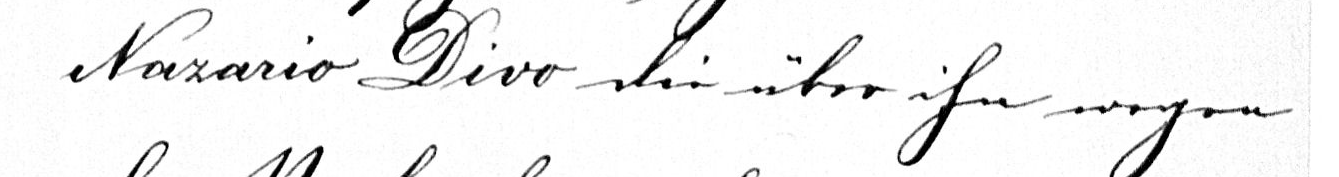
Nazario Divo die über ihn wegen
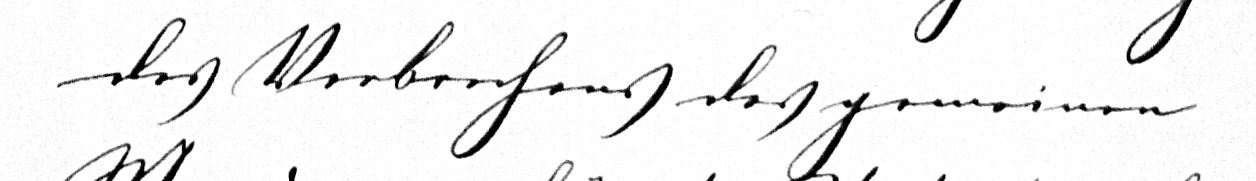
des Verbrechens des gemeinen
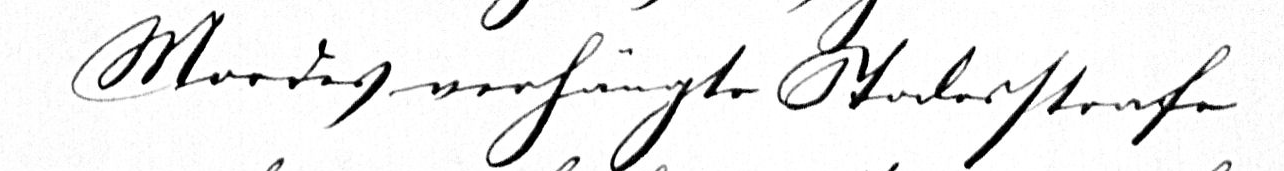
Mordesverhängte Todesstrafe
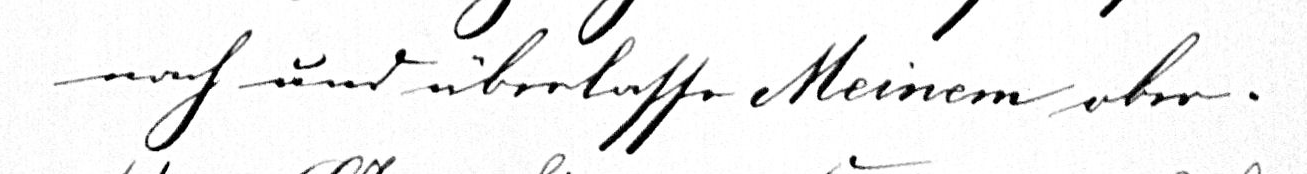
nach und überlasse Meinem ober
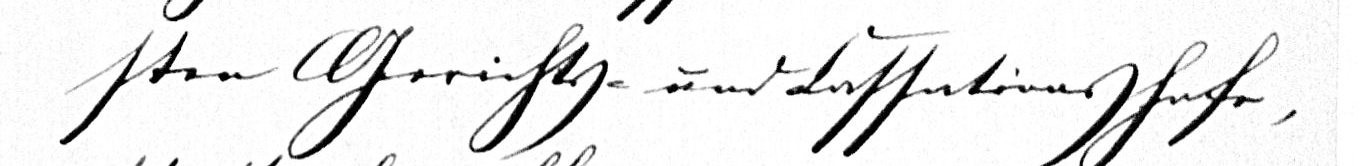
sten Gerichts- und Cassationshofe,
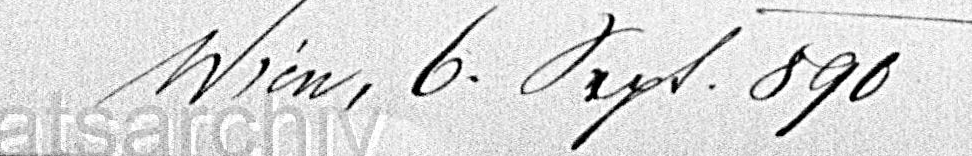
Wien, 6. Sept. 890
